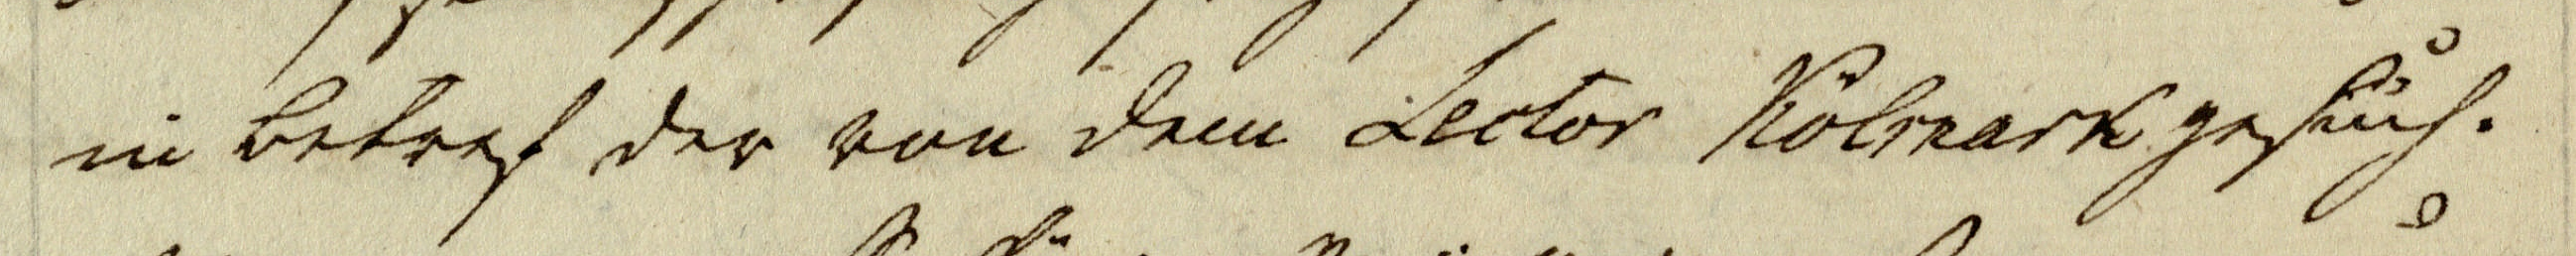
in Betref der von dem Rector Kölmark gesuch¬
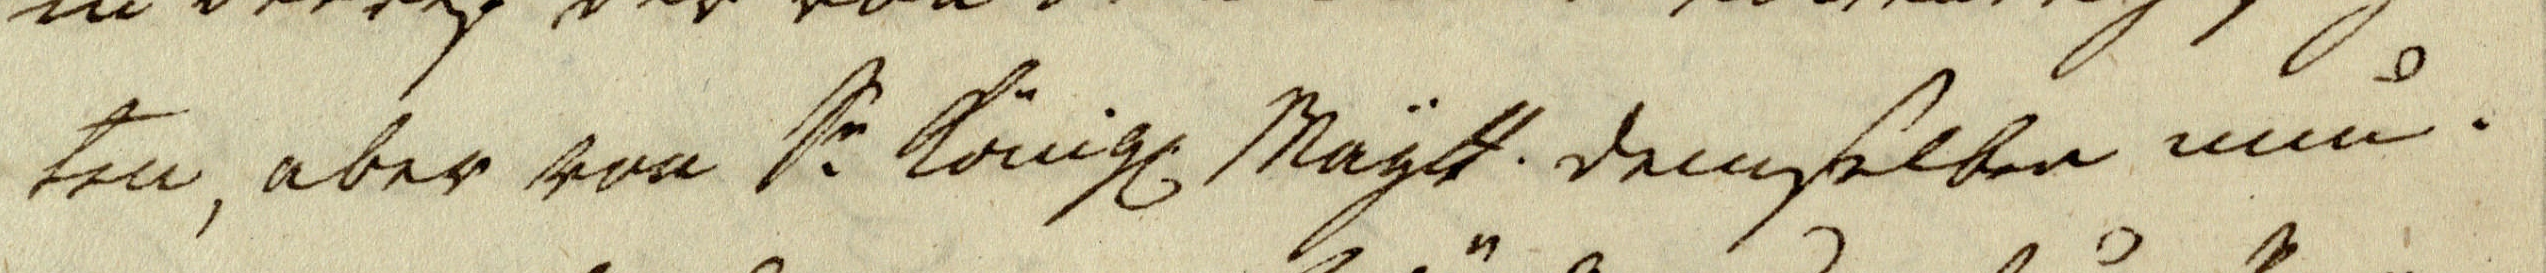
ten, aber von Sr Königl. Maÿst. demselben nun¬
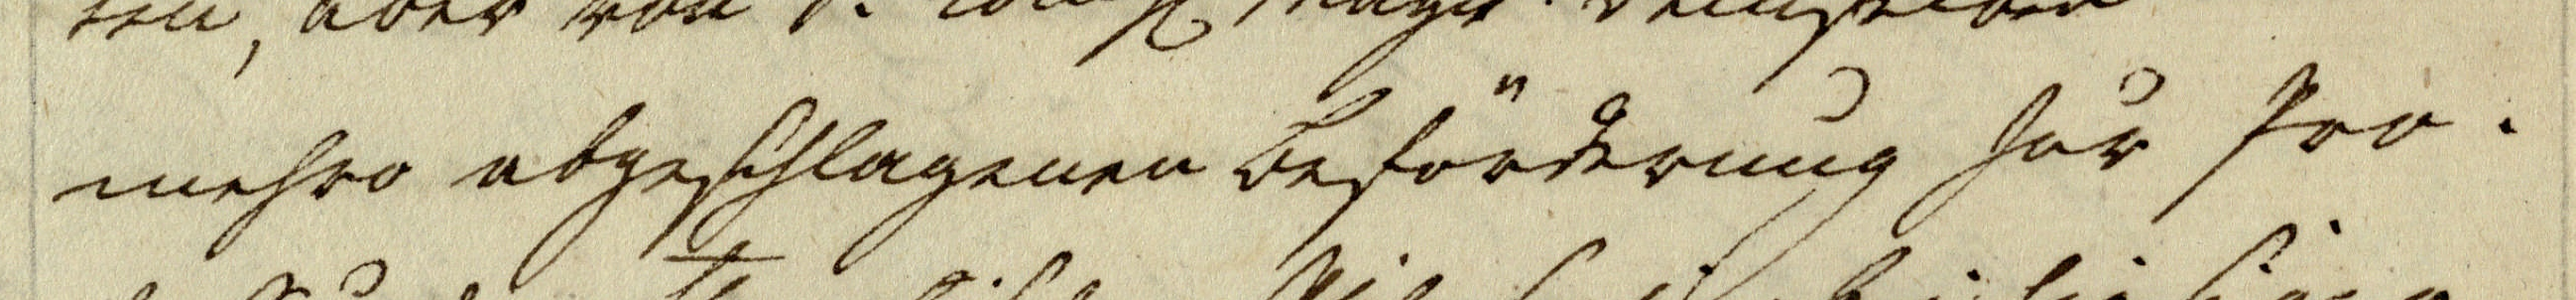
mehro abgeschlagenen Beförderung zur Pro¬
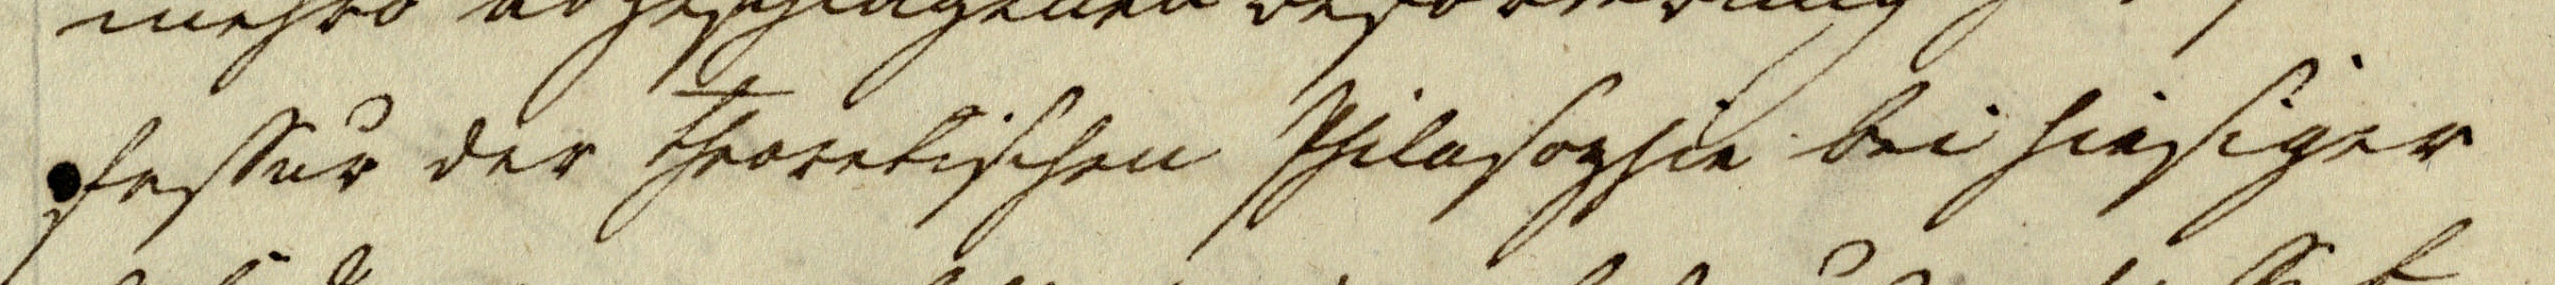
fessur der theoretischen Philosophie bei hiesiger
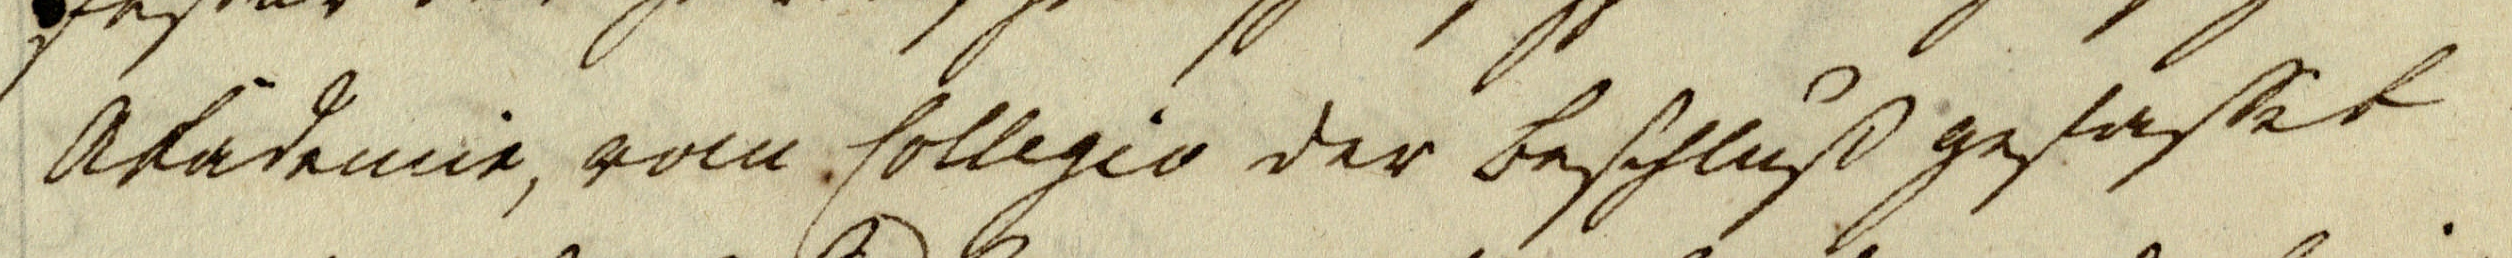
Akademie, vom Collegio der Beschluß gefasset
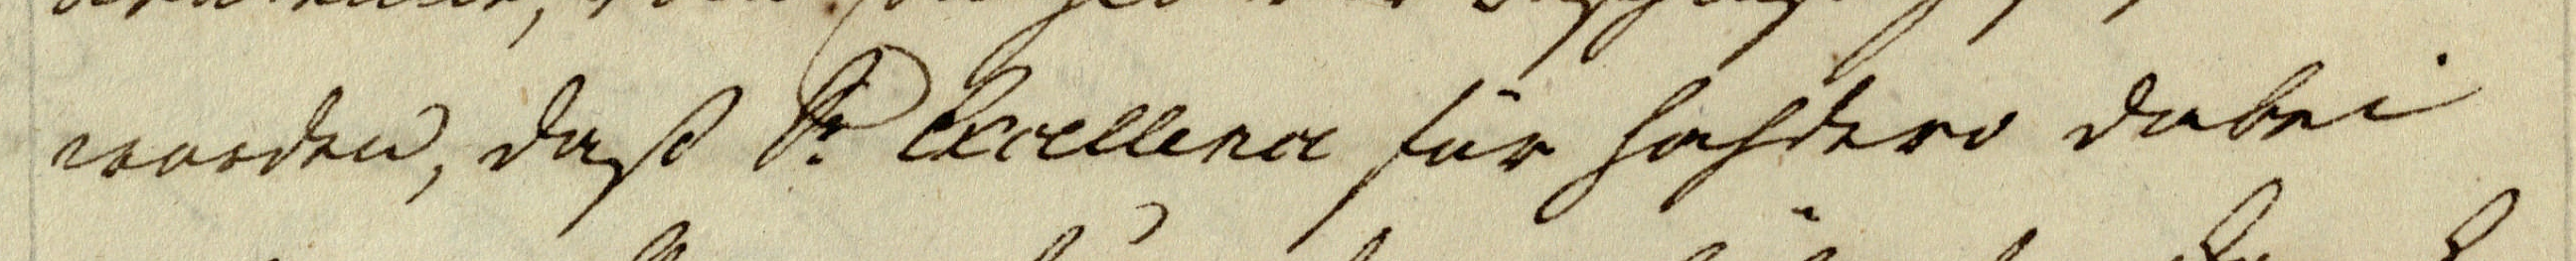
worden, daß Sr Excellence für hochdero dabei
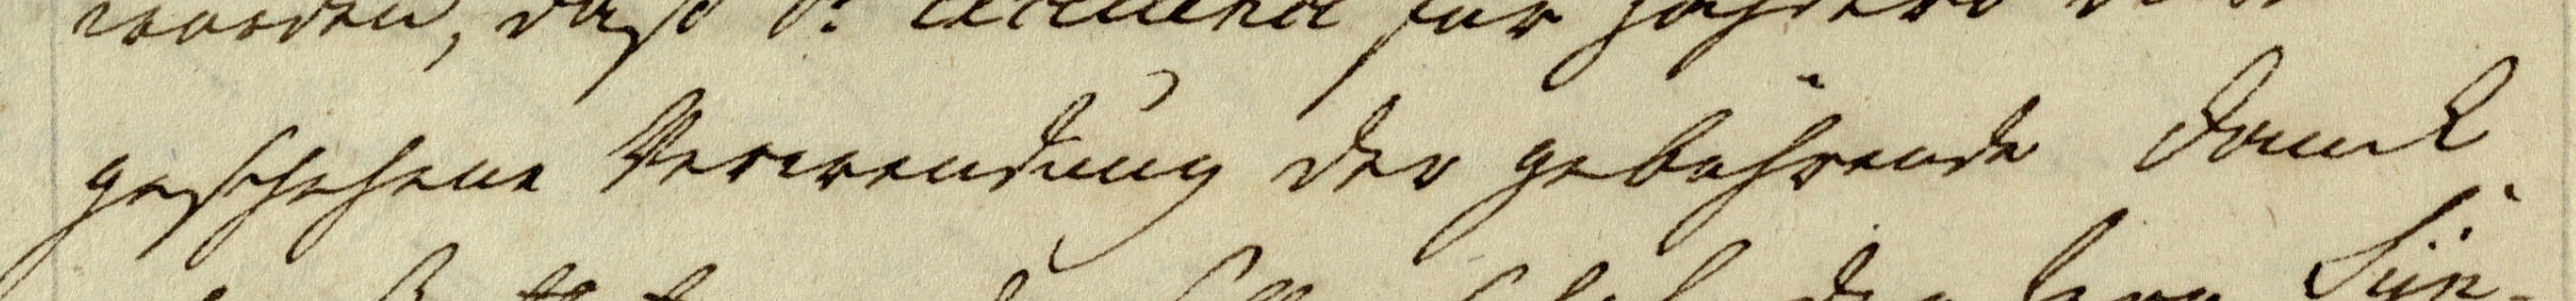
geschehene Verwendung der gebührende Danck
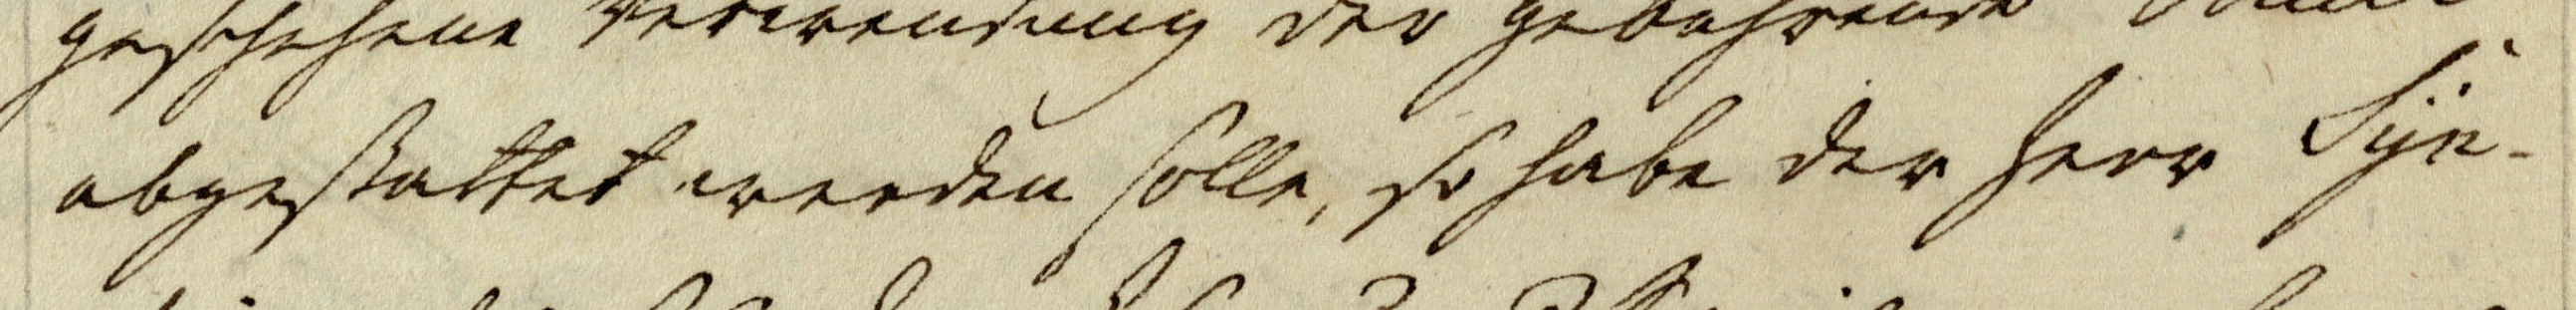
abgestattet werden solle, so habe der Herr Sÿn¬
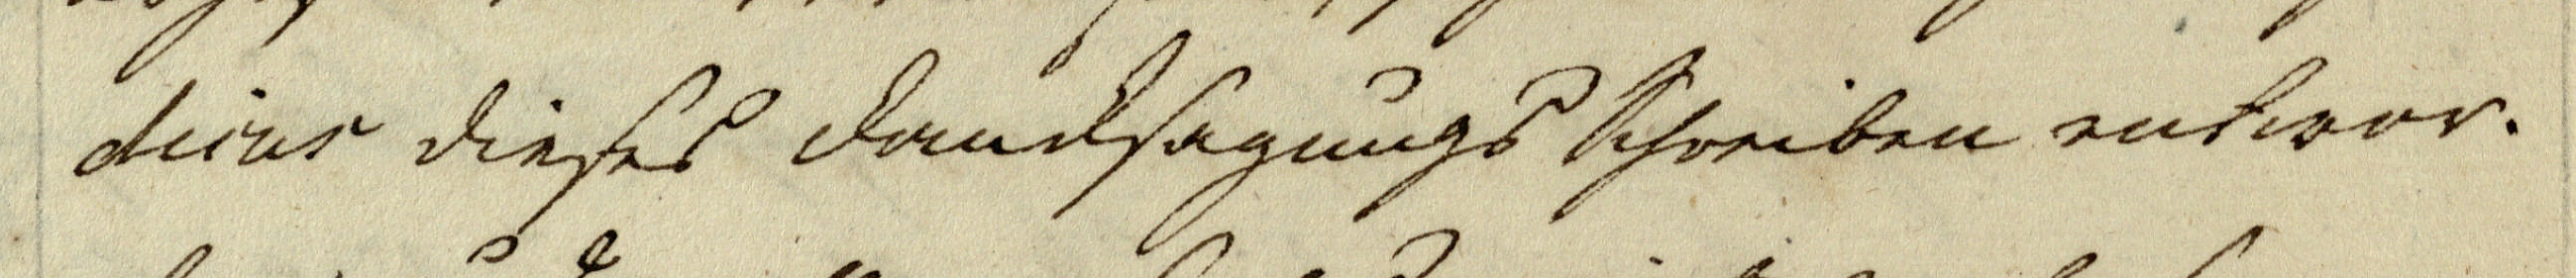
dicus dieses Dancksagungs Schreiben entwor¬
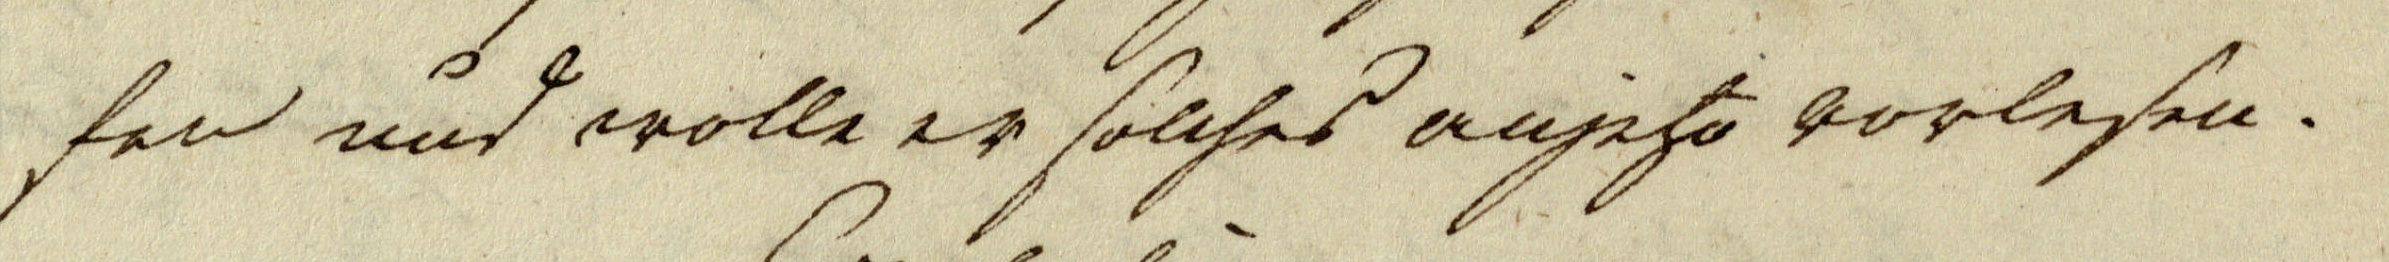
fen und wolle er solches anjetzo vorlesen.
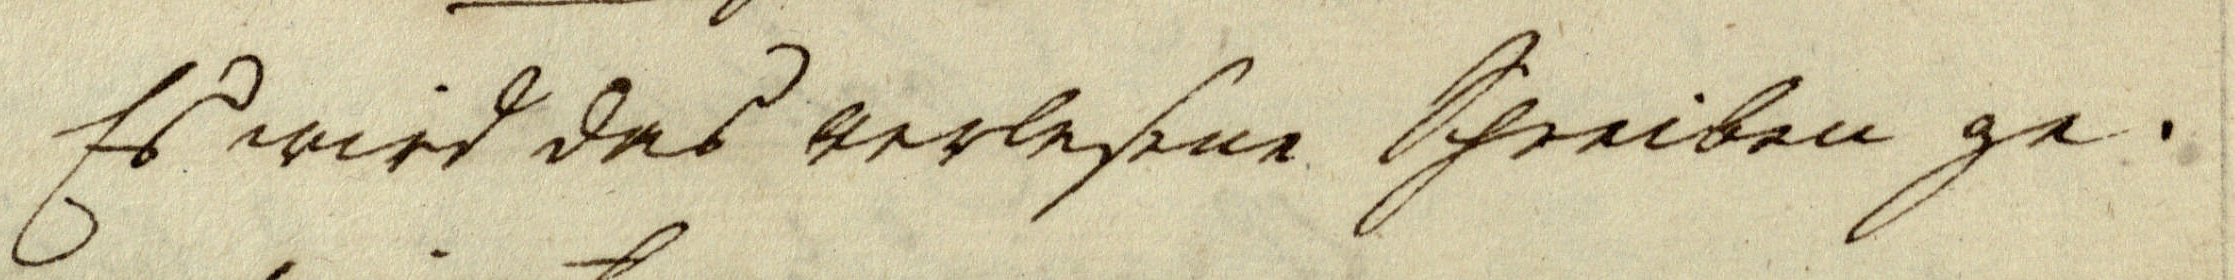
Es wird das verlesene Schreiben ge¬
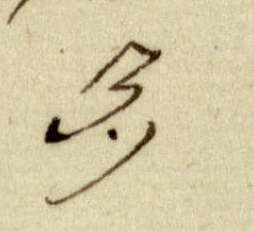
3.,
